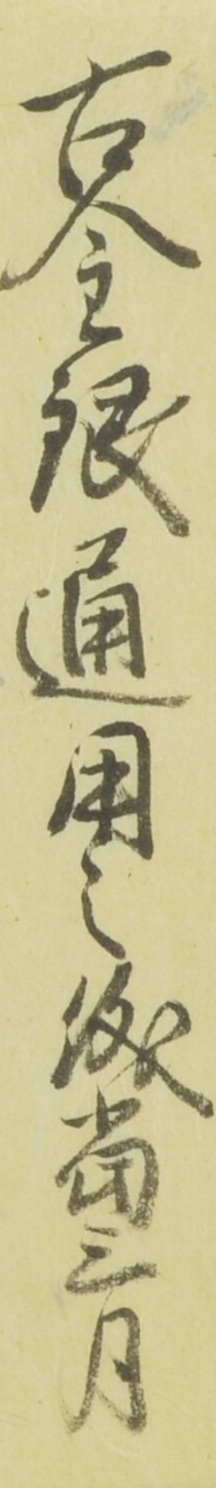古金銀通用之儀当三月
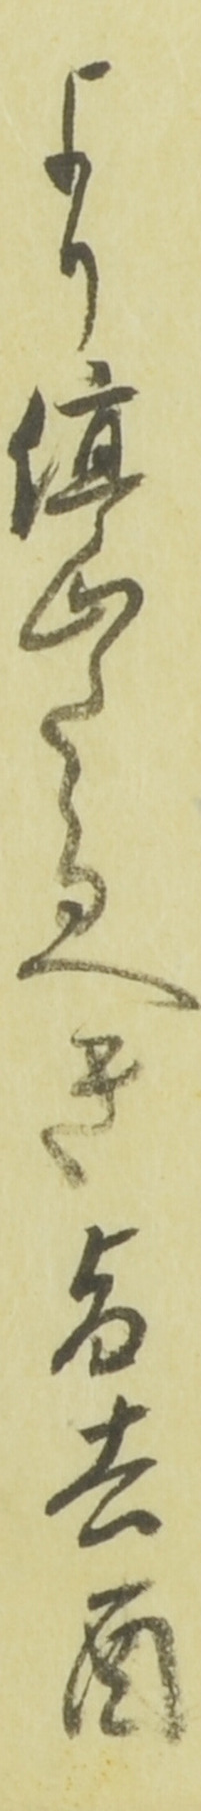より停止たるへき旨去酉
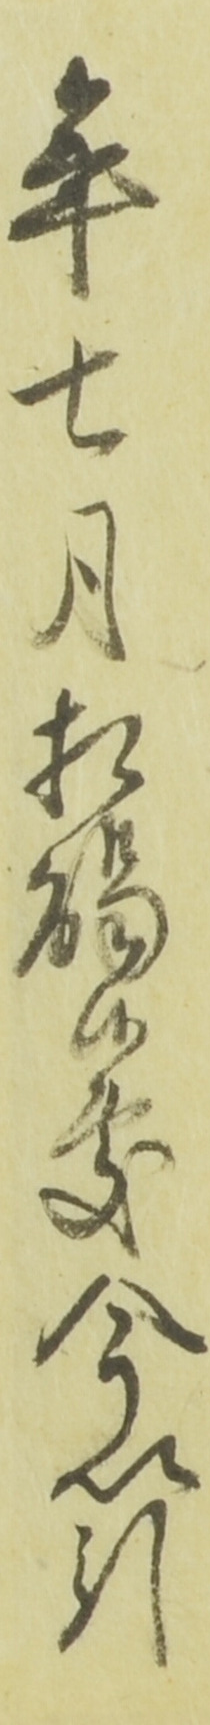年七月相触候処今以引
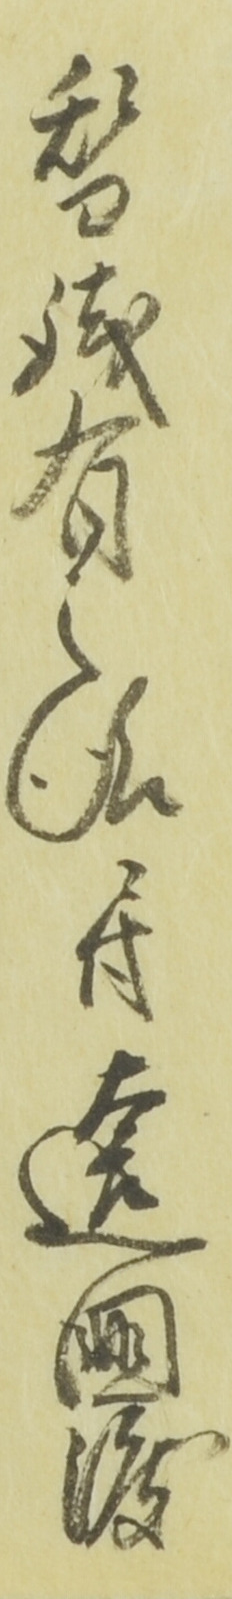替銭有之趣ニ付遠国渡
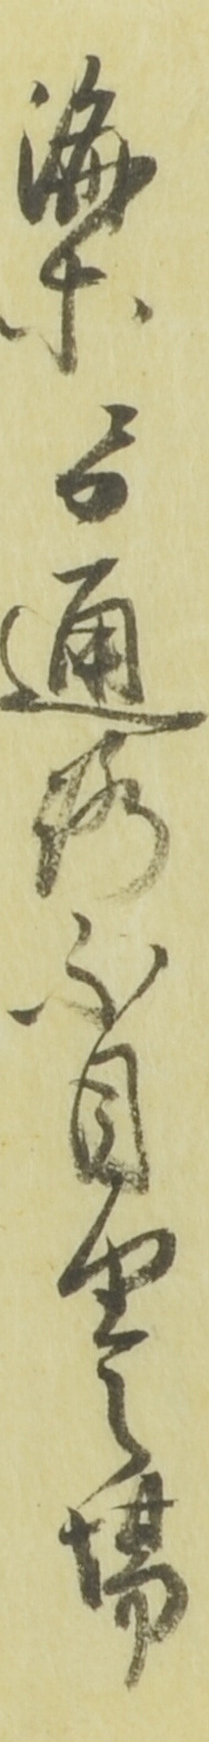海等ニ而通路不自由之場
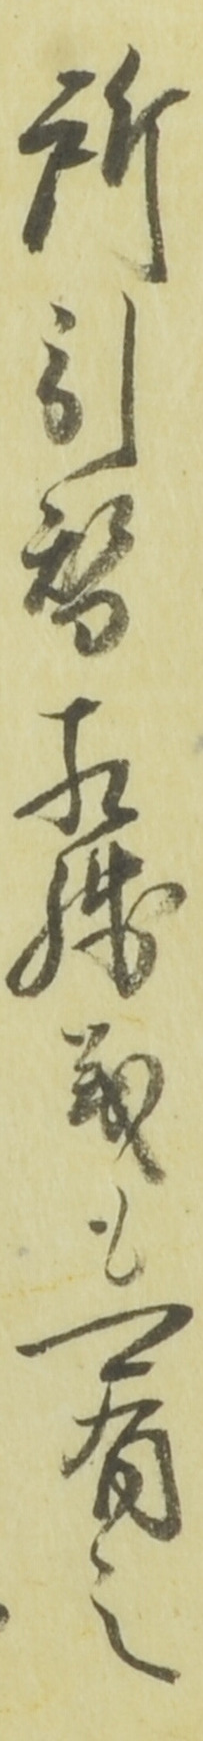所引替相残義も可有之
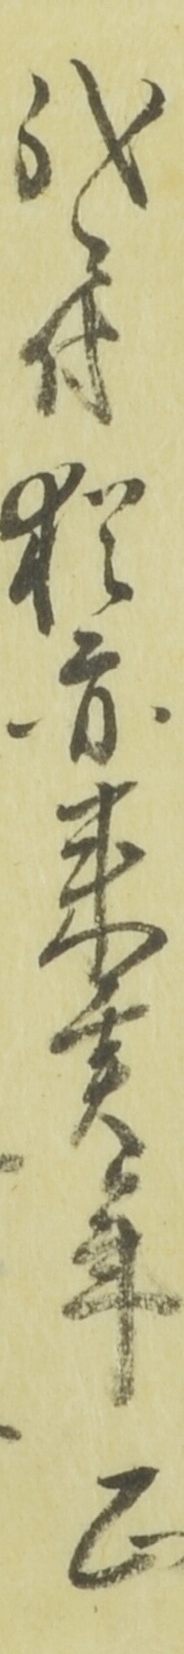哉ニ付猶亦来亥年正
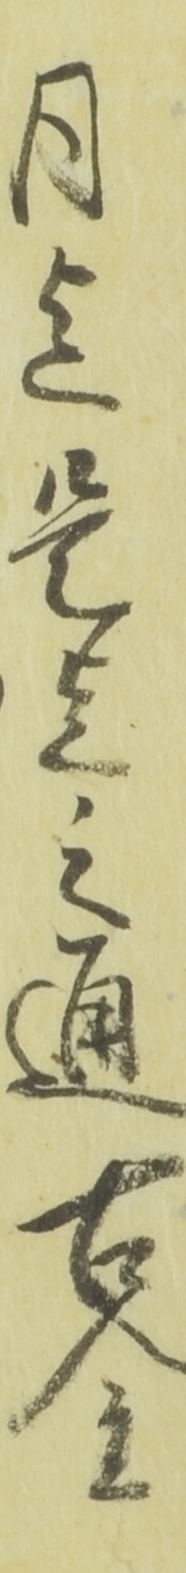月迄是迄之通古金
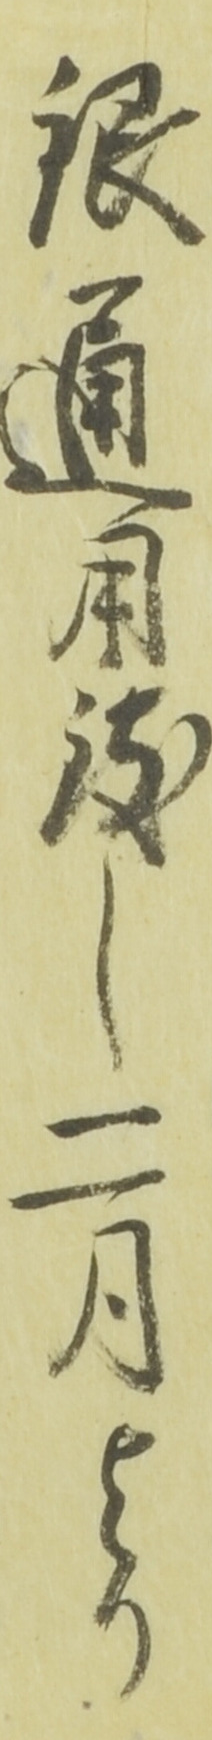銀通用致し二月より
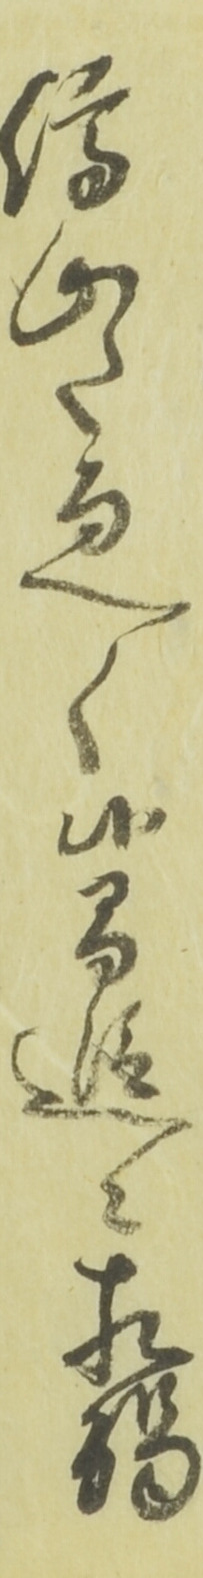停止たるへく候間追々相触
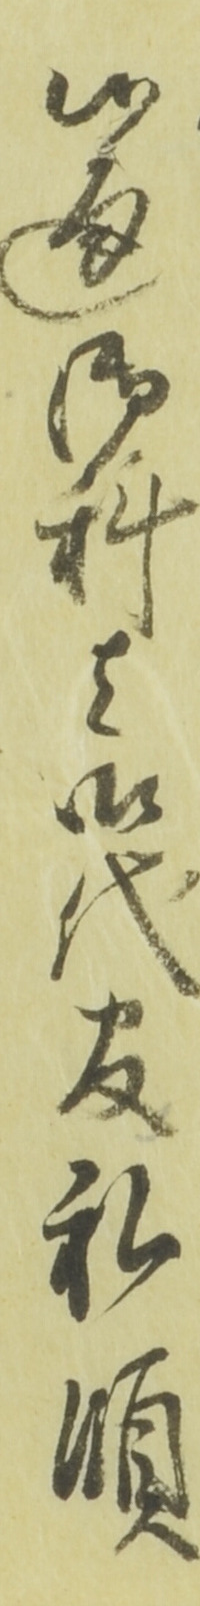候通御料は御代官私領
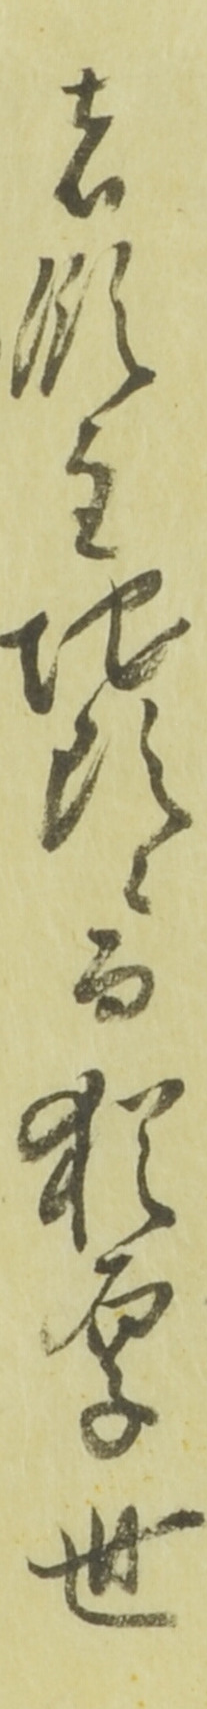は領主地頭ニ而猶厚世
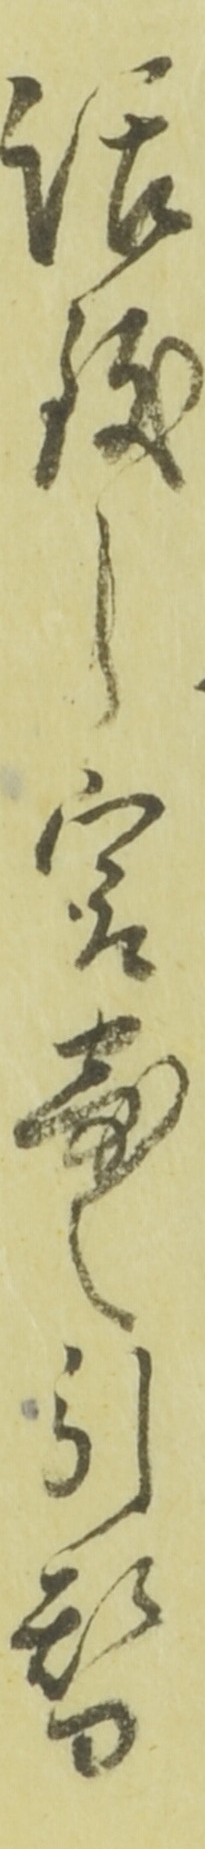話致し最寄之引替
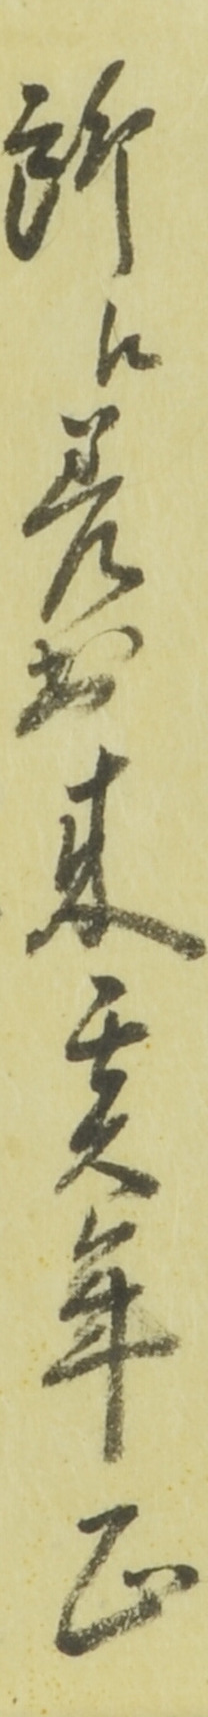所江差出来亥年正
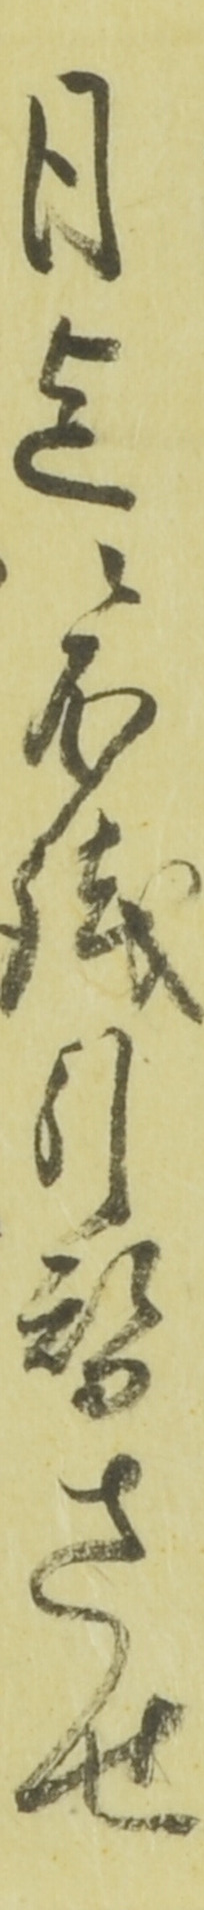月迄ニ不残引替させ
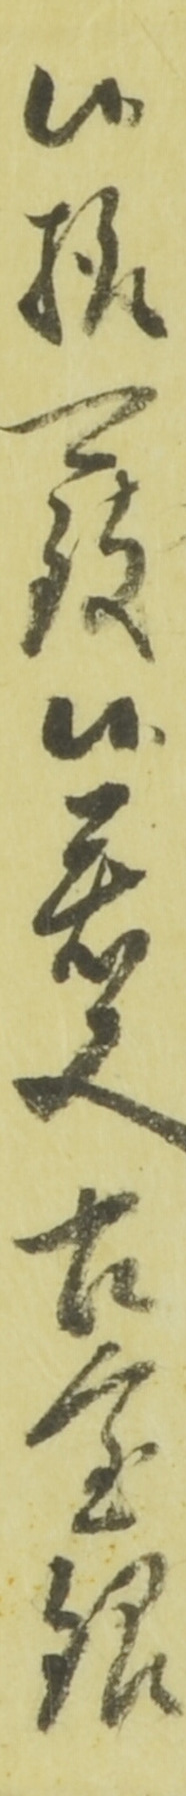候様可致候若又古金銀
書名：御触書御書附控
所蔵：伊那市立高遠町図書館・合同会社AMANE
